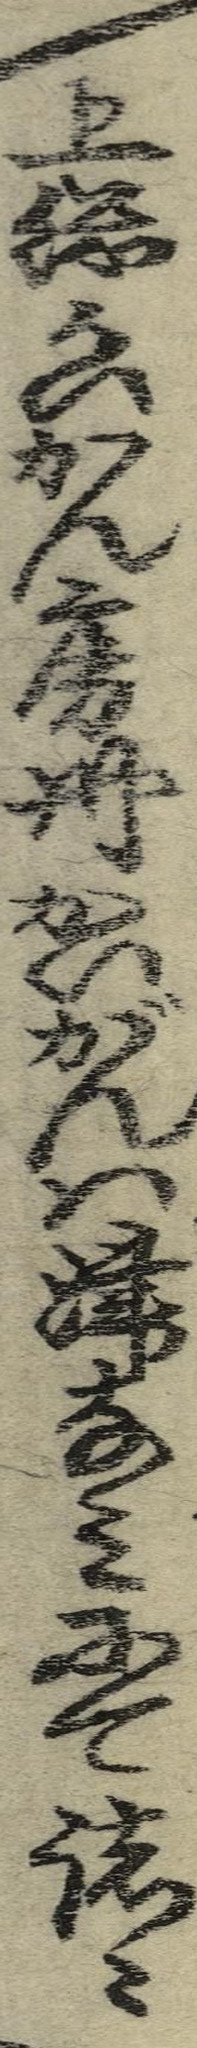上総かいがん房州かいがんハ津なミにて諸々
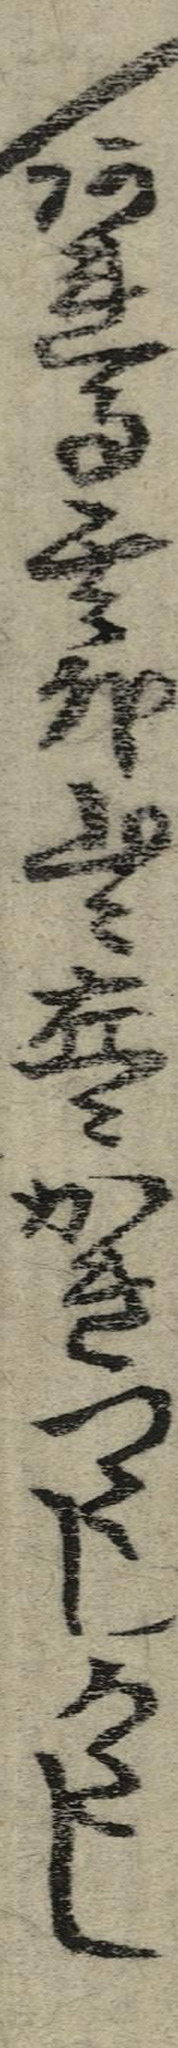あれる其外山々在々かきつくしかたし
